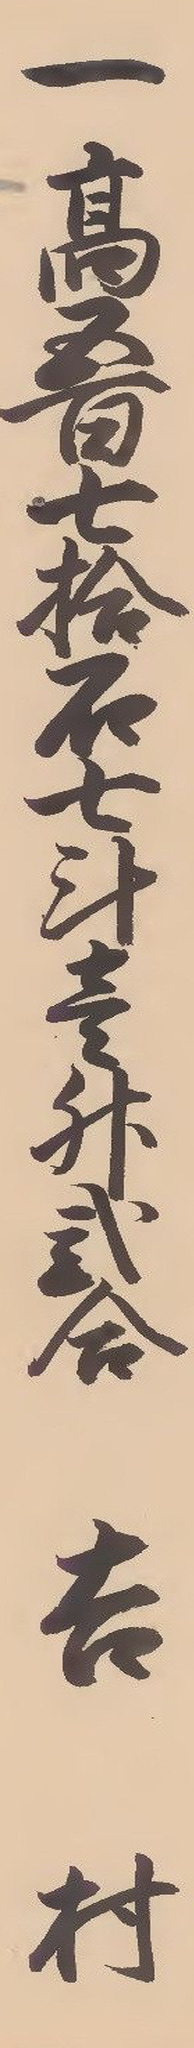一高五百七拾石七斗壱升弐合吉村

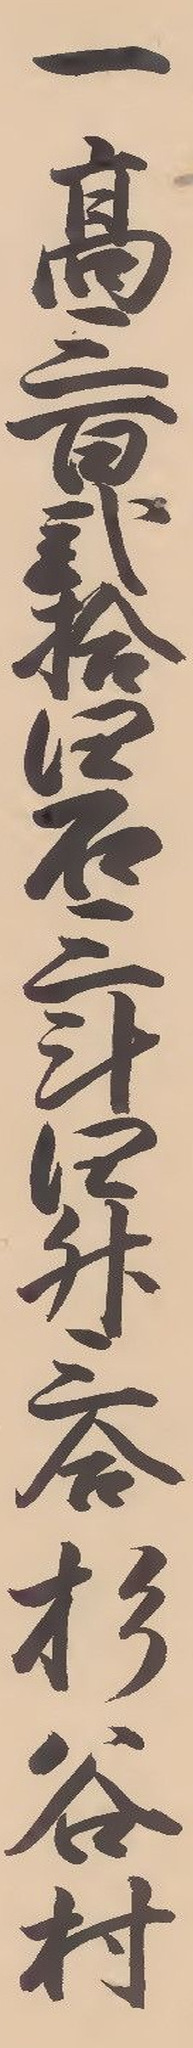一高三百弐拾四石三斗四升三合杉谷村
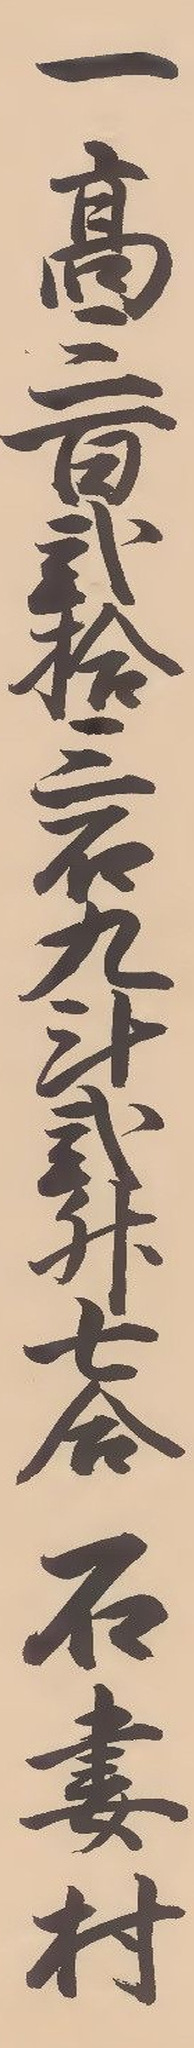一高三百弐拾三石九斗弐升七合石妻村
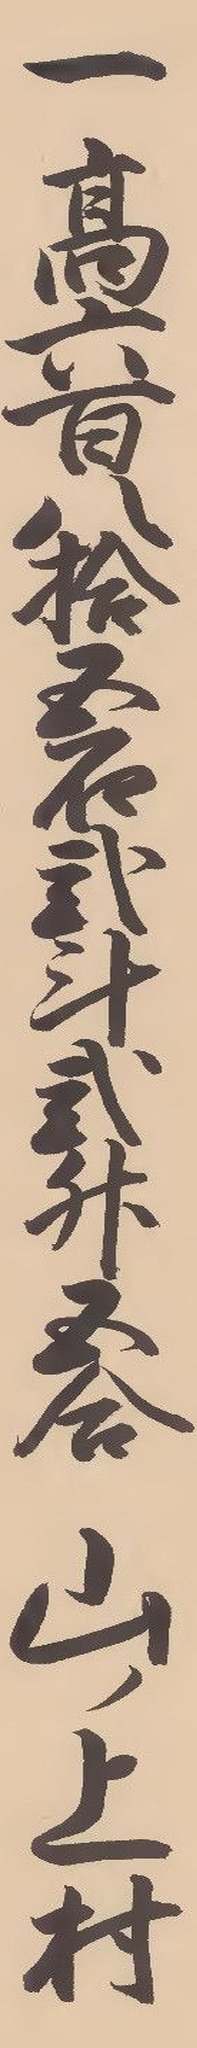一高六百八拾五石弐斗弐升五合山ノ上村
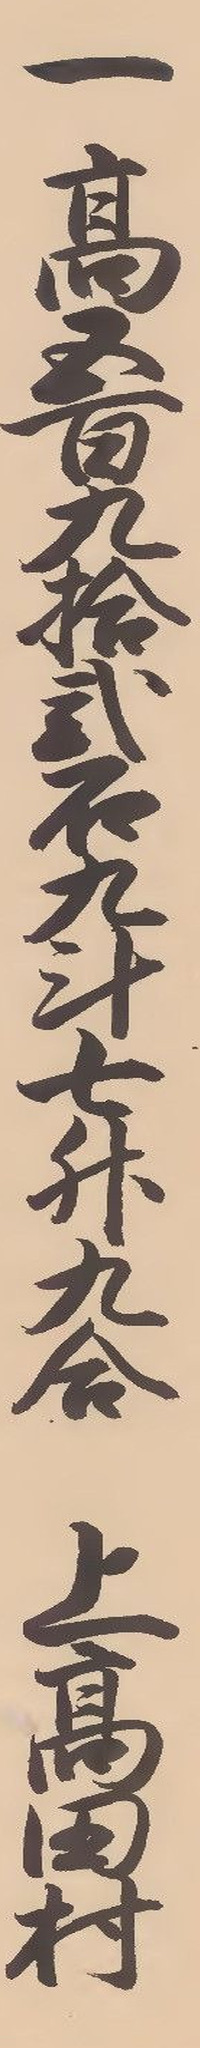一高五百九拾弐石九斗七升九合上高田村
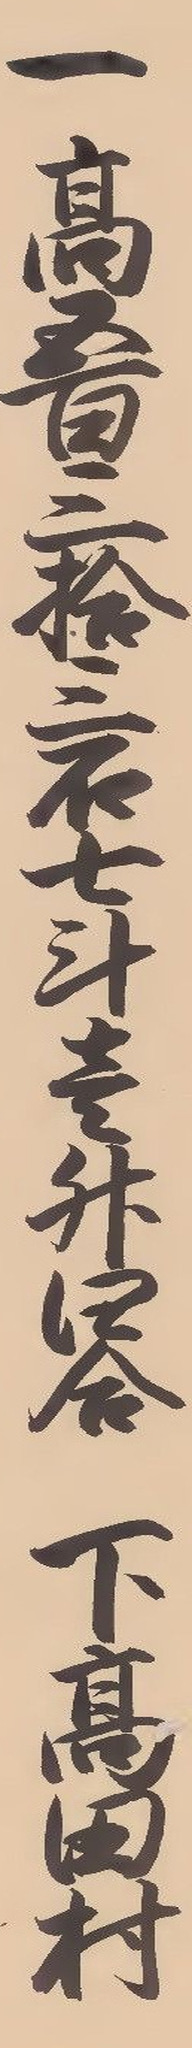一高五百三拾三石七斗壱升四合下高田村
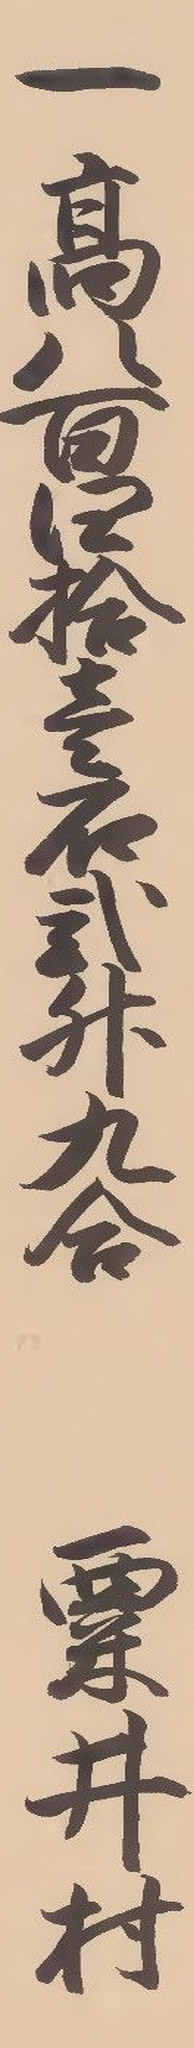一高八百四拾壱石弐升九合粟井村
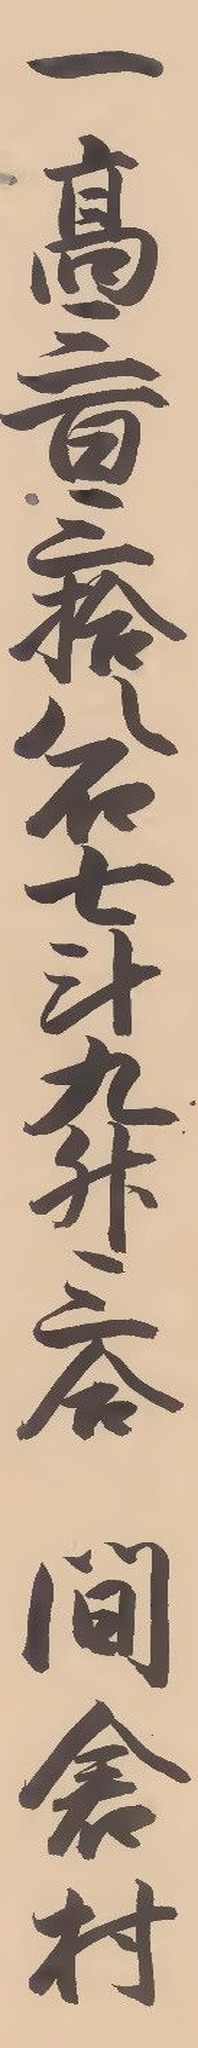一高三百三拾八石七斗九升三合間倉村

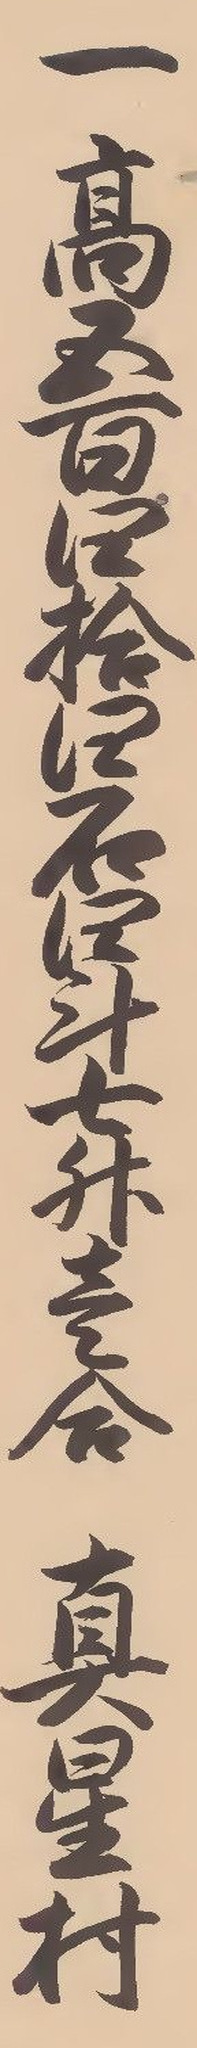一高五百四拾四石四斗七升壱合真星村
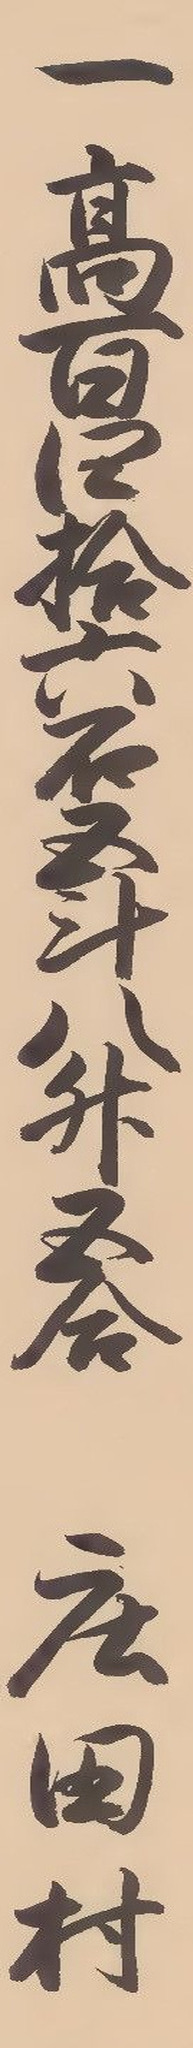一高百四拾六石五斗八升五合庄田村
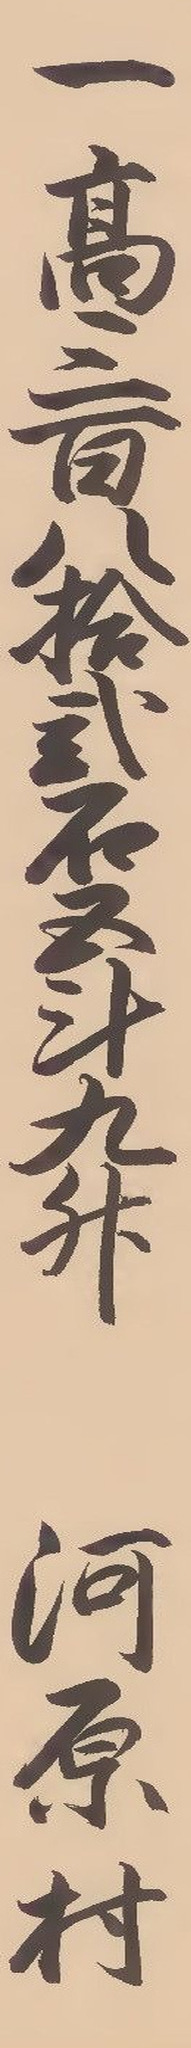一高三百八拾弐石五斗九升河原村
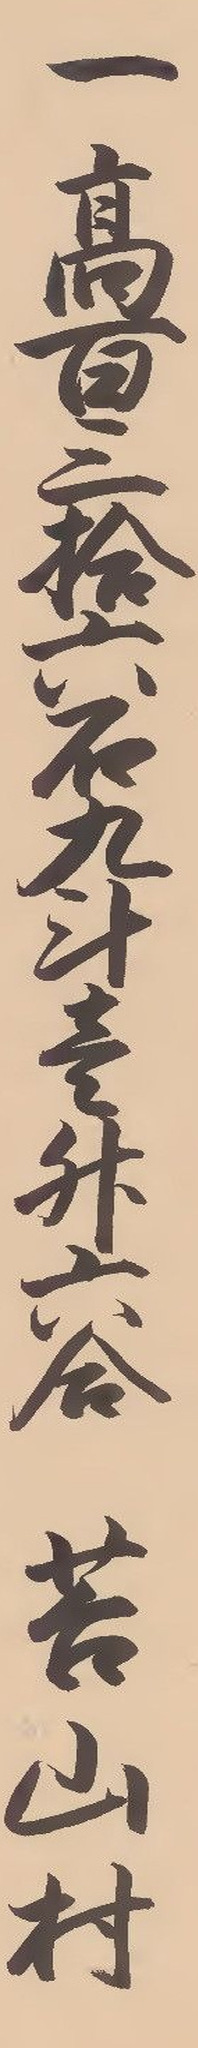一高百三拾六石九斗壱升六合苔山村
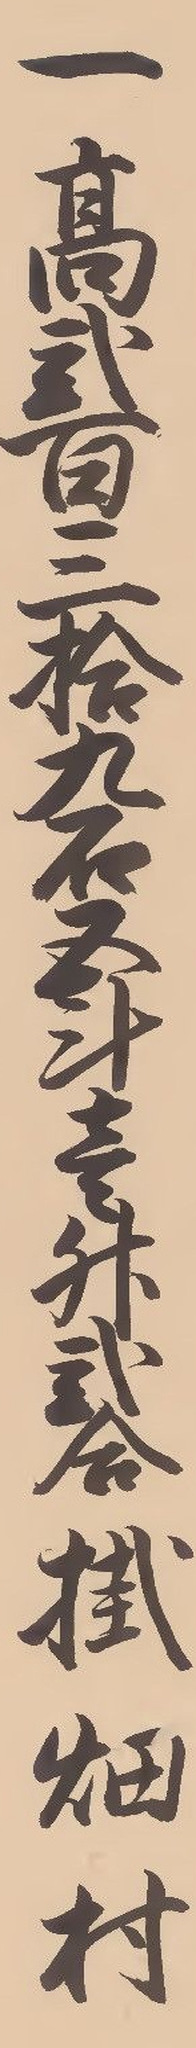一高弐百三拾九石五斗壱升弐合掛畑村
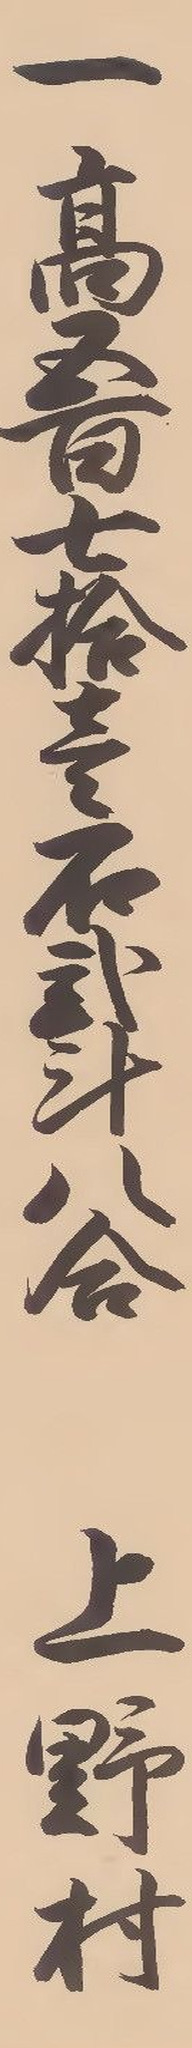一高五百七拾壱石弐斗八合上野村
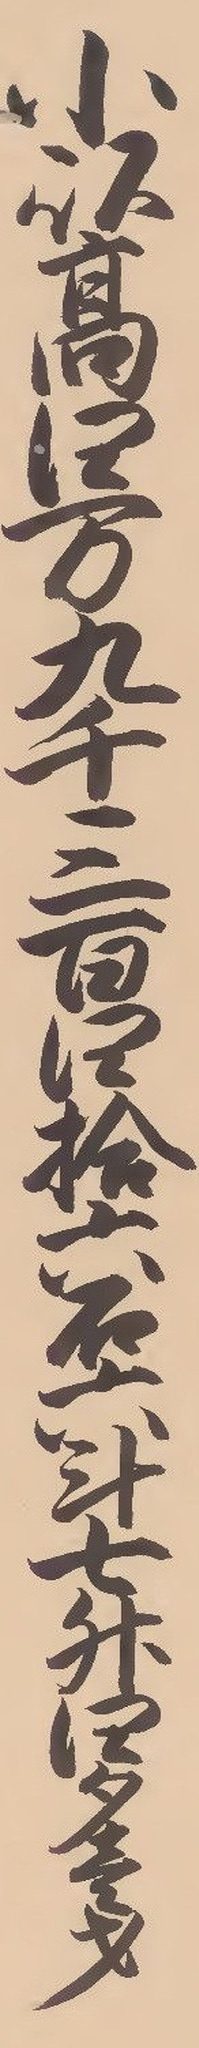小以高四万九千三百四拾六石六斗七升四勺壱才

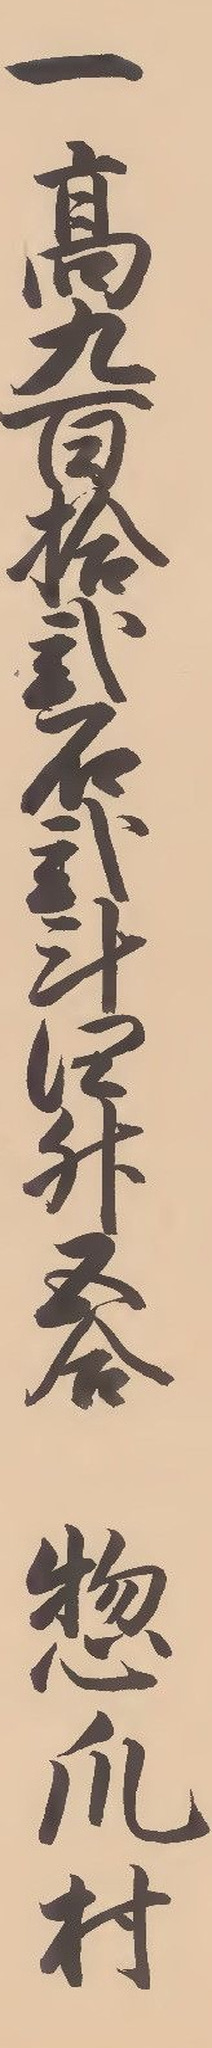一高九百拾弐石弐斗四升五合惣爪村
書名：備中国郷帳
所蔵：国立公文書館 National Archives of Japan
